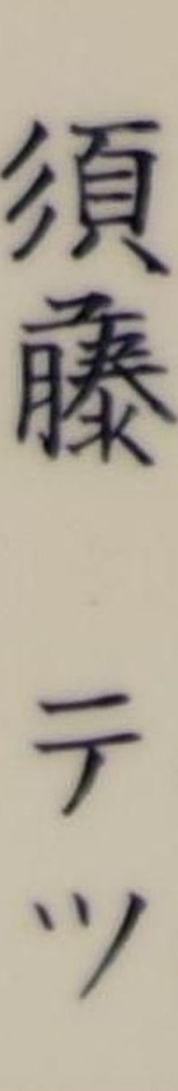須藤テツ
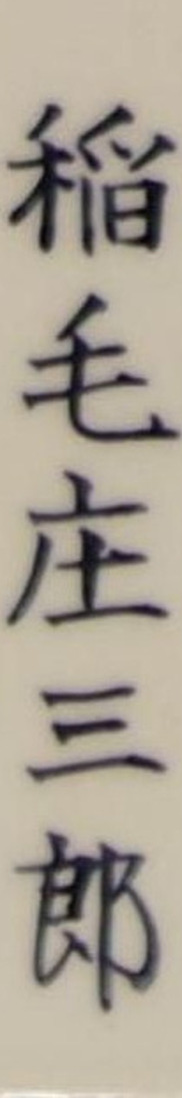稲毛庄三郎
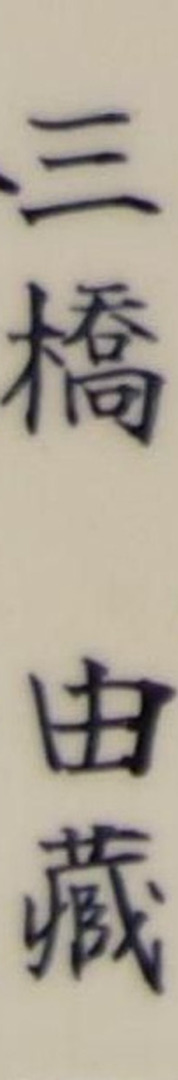三橋由蔵
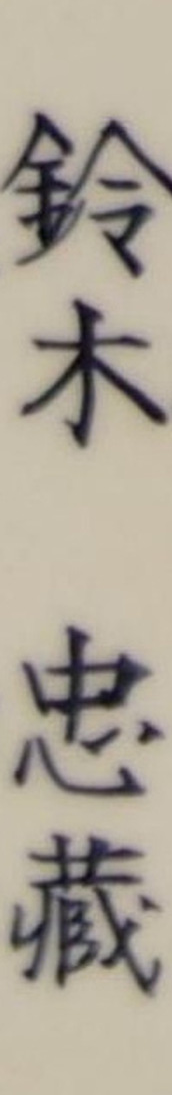鈴木忠蔵
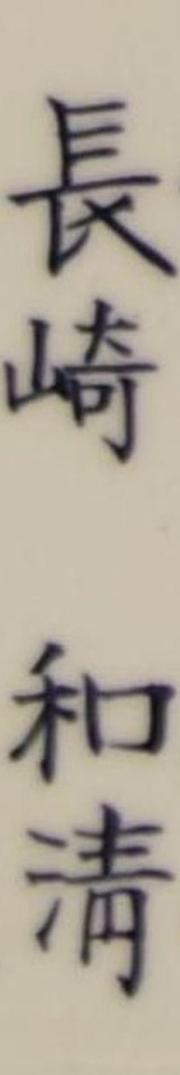長崎和清
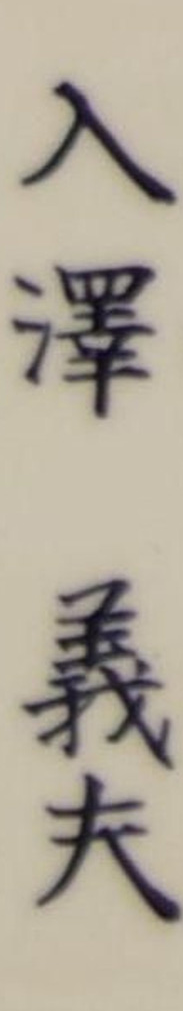入澤義夫
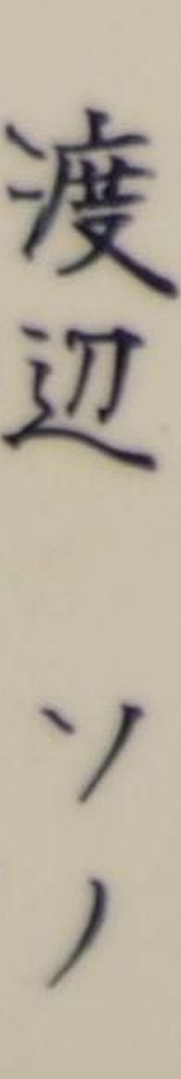渡辺ソノ
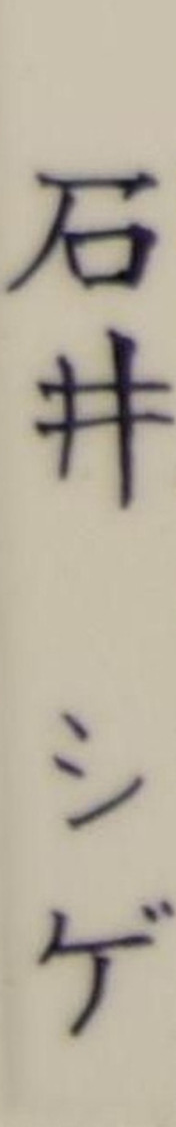石井シゲ

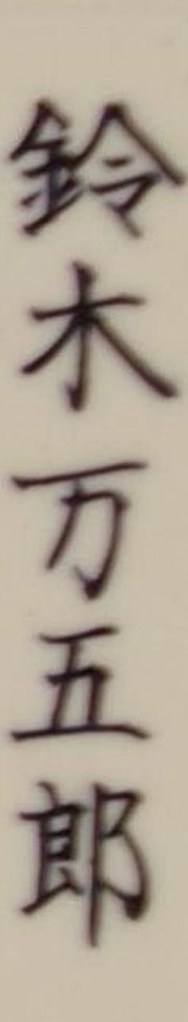鈴木万五郎
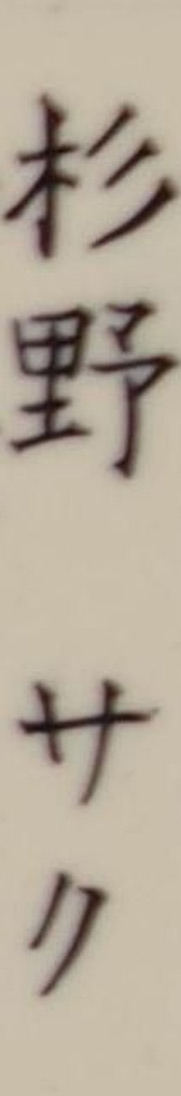杉野サク
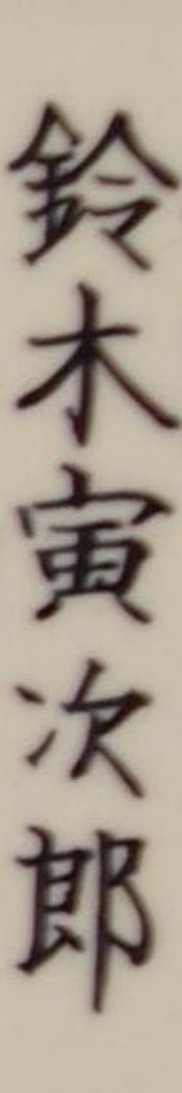鈴木寅次郎
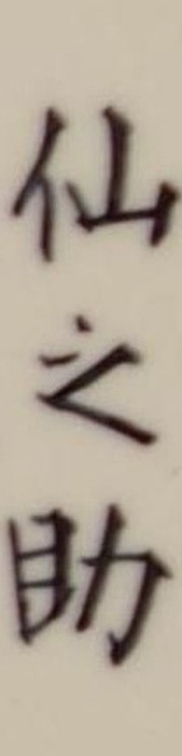仙之助
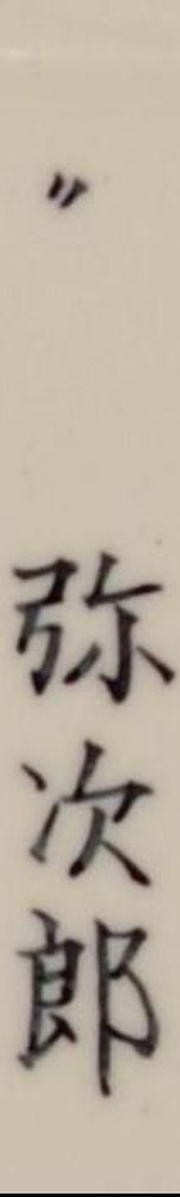弥次郎
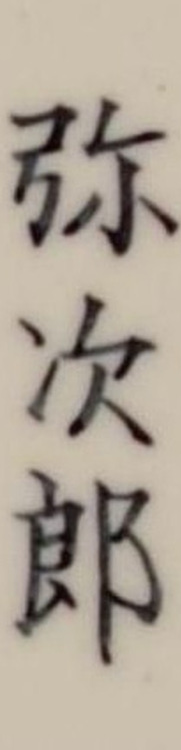弥次郎
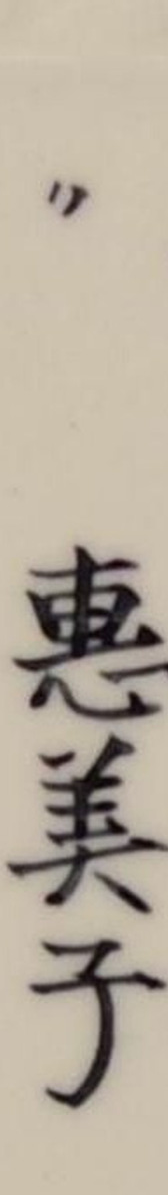恵美子
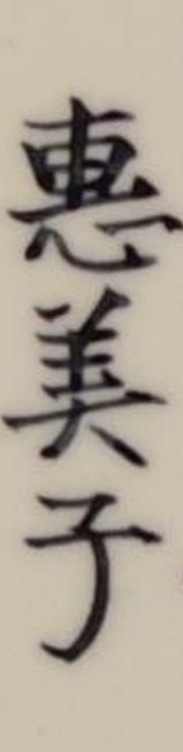恵美子
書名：M~S
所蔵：高野山金剛峯寺
